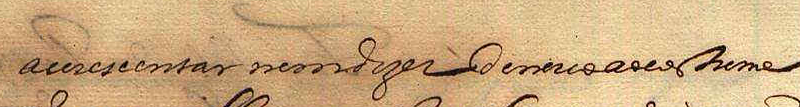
accrescentar nem dizer de nouo ao costume
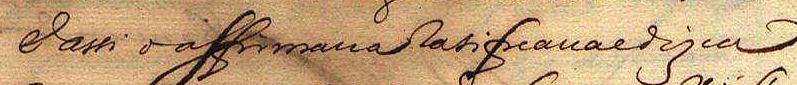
& assi o affirmaua Ratificaua e dizia
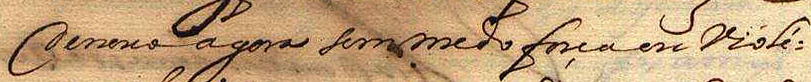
de nouo agora sem medo força ou violē
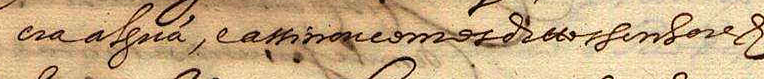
cia alguā e assinou com os dittos Senhores
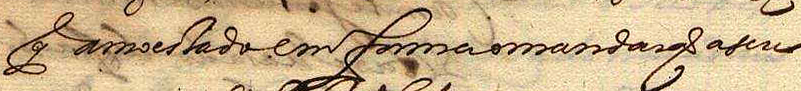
q̄ amoestado em forma o mandaraõ a seu
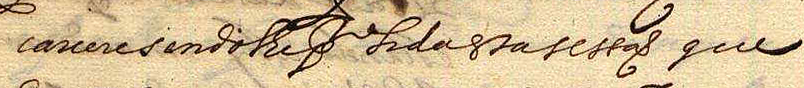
carcere sendo lhe pro lida esta sessaõ que
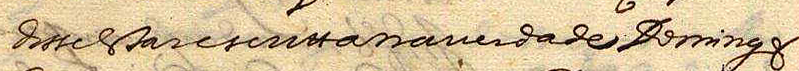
disse estar escritta na uerdade Domingos
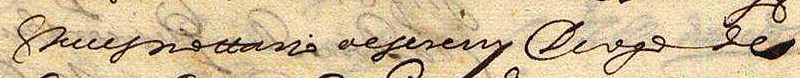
Steues nottario o escreuy Deogo de
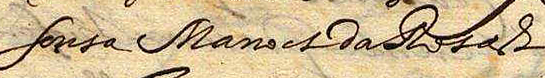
Sousa Manoel da Rosa
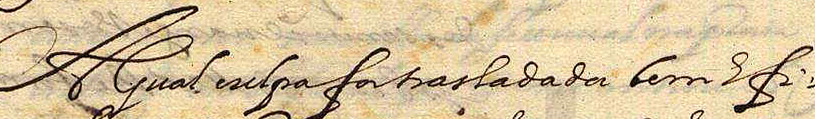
A qual culpa foi trasladada bem E fi
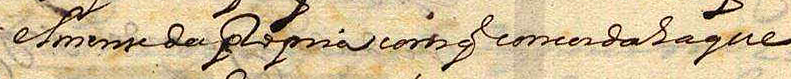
elmente da propria com q̄ concorda E a que
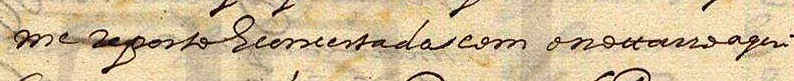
me reporto E concertada com o nottario aqui
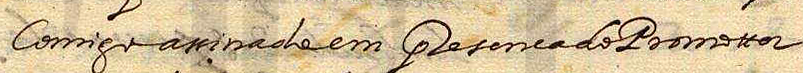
Comigo assinado em presença do Promottor
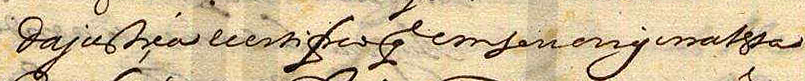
da justiça e certifico q̄ em seu orijenal esta
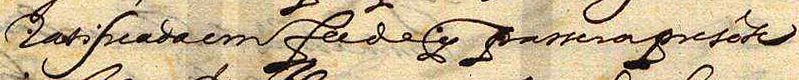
Ratificada em fee de q̄ passera presēte
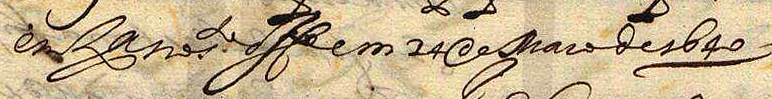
em Lx no sto offo em 24 de Maio de 1640
